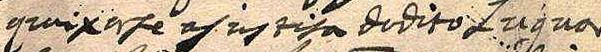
queixarse a justisa do dito Luguar
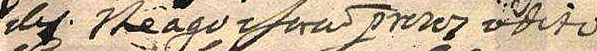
de s. Theago e foraõ prezos o dito
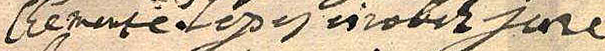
Clemente Lopes e izabel Jorie
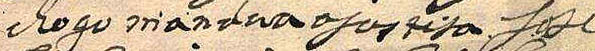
e logo mandara a justisa. fose
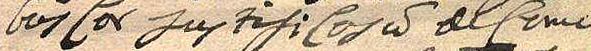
busCar justifiCasaõ de Como
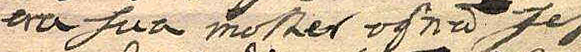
era sua molher o q̄ naõ fes
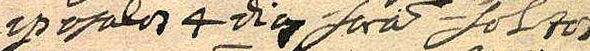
e pasados 4 dias foraõ soLtos
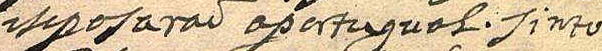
e se pasaraõ a portuguaL. sinto
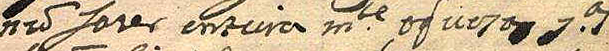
naõ fazer enteiramte. o q̄ uosas s.as
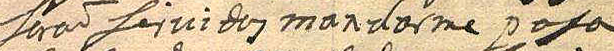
Foraõ siruidos mandarme posa
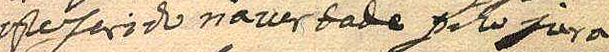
o Referido na uerdade pelo jura
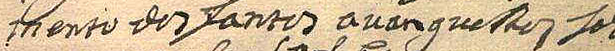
mento dos santos auanguelhos sal
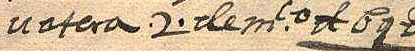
uatera .2. de mco. d̄ 690
